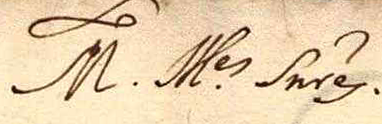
M.to Ill.es Snrēs.
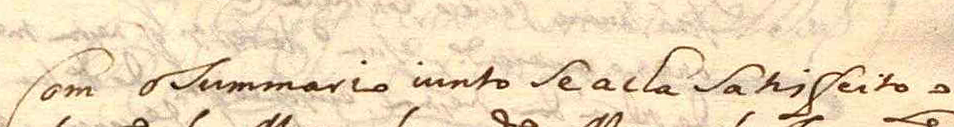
Com o Summario iunto se acha satisfeito o
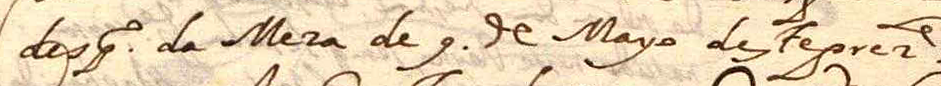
desp.o da Meza de 9. de Mayo deste prez.te
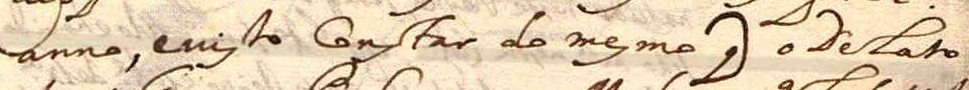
anno, e uisto Constar do mesmo, q̄ o Delato
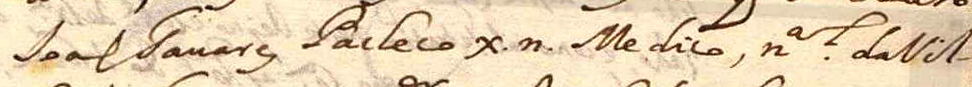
Ioaõ Tauares Pacheco x. n. Medico, n.al da Vil
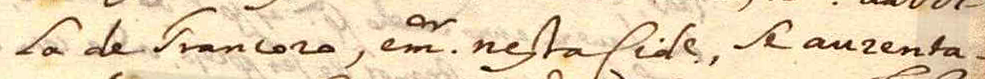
la de Trancozo, e mor. nesta Cid.e, se auzenta
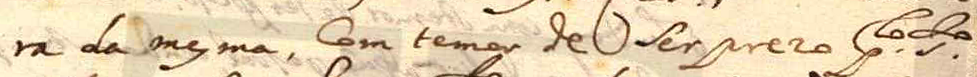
ra da mesma, Com temor de ser prezo p.lo s.to
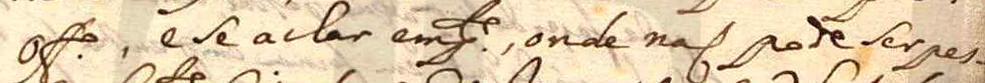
off.o, e se achar em p.te, onde naꝭ pode ser pes
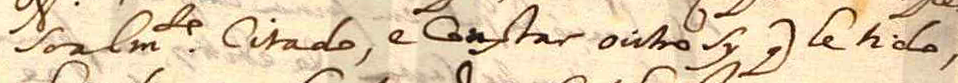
soalm.te Citado, e Constar outrosy q̄ he tido,
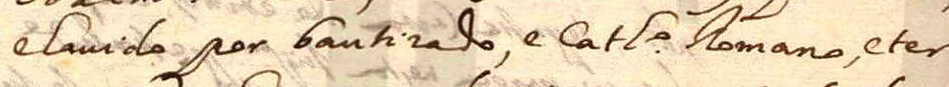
e hauido por bautizado, e Cath.o Romano, e ter
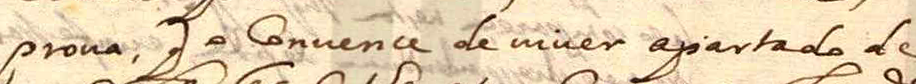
proua, q̄ o Conuence de uiuer apartado de
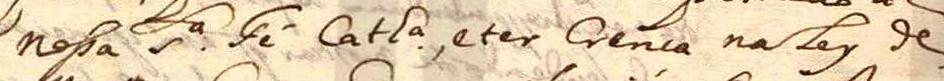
nossa sta. Fé Catha., e ter Crença na Ley de
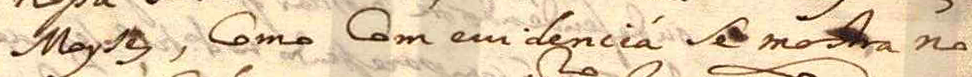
Moyses, Como Com euidencia se mostra no
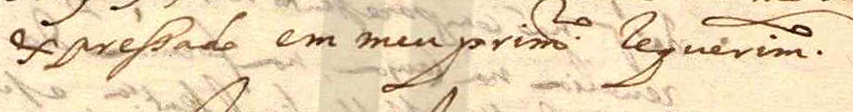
expressado em meu primro. Requerimto.
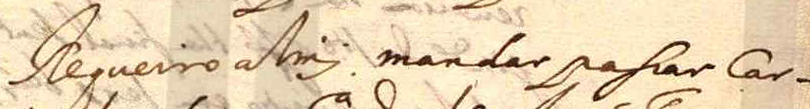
Requeiro a Vm̄s mandar passar Car
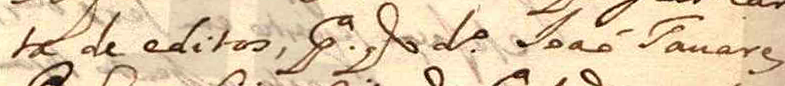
ta de editos, p.a q̄ o d.o Ioaõ Tauares
